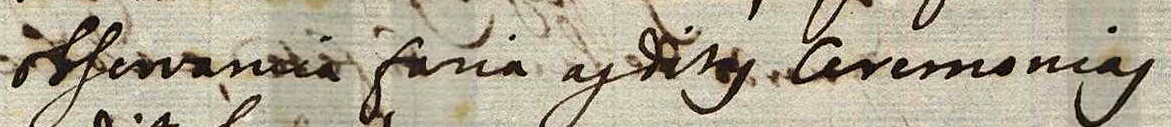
observancia fazia as ditas Ceremonias
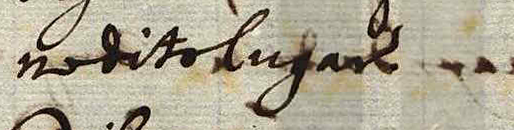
no dito lugar.
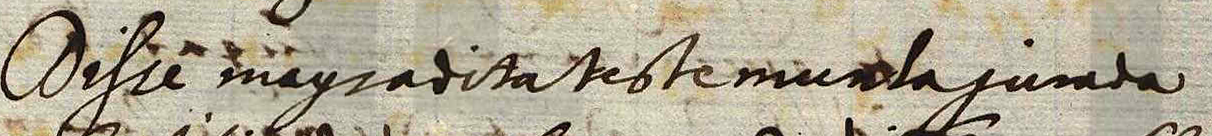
Disse mays a dita testemunha jurada
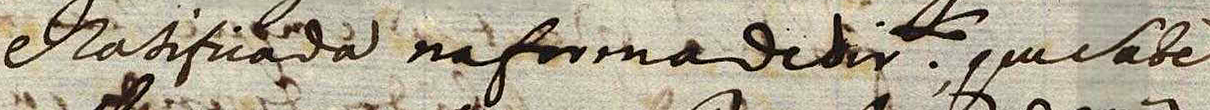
e Ratificada na forma de dir.to, que sabe
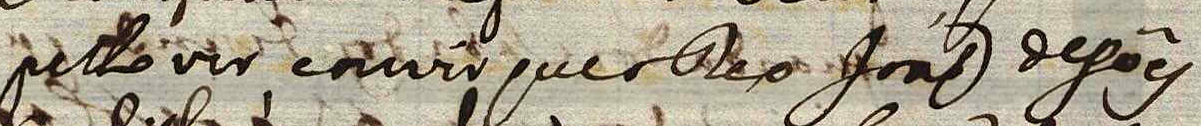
pello vir, e ouvir que o Reo Joaõ de gôes
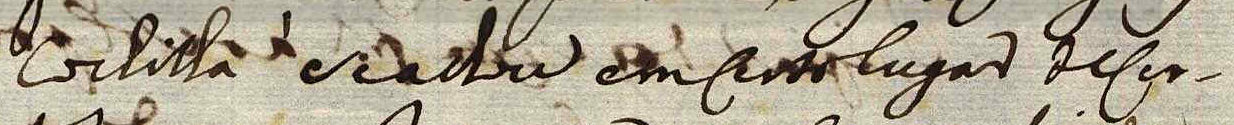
Cochilha se achou em Certo lugar de Cer
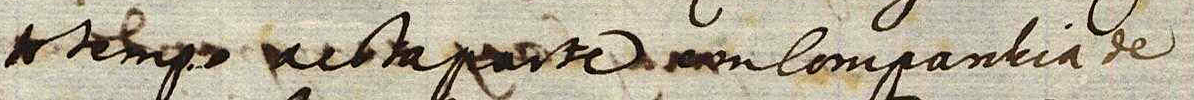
to tempo a esta parte em Companhia de
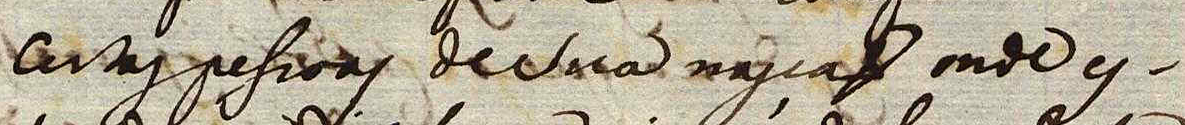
certas pessoas de sua nasçaõ onde es
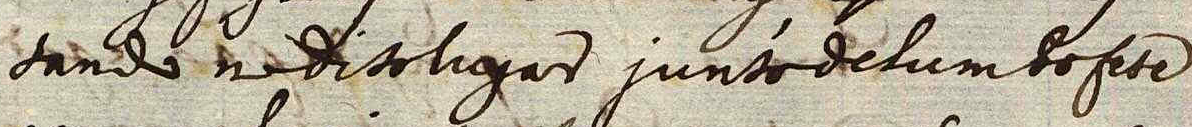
tando no dito lugar junto de hum bofete
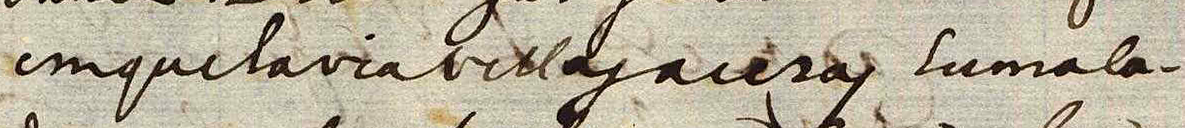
em que havia vellas acezas huma ca
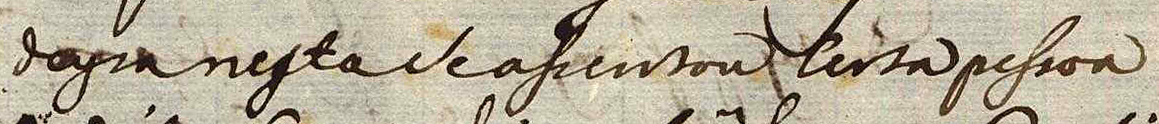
deyra nesta se assentou certa pessoa
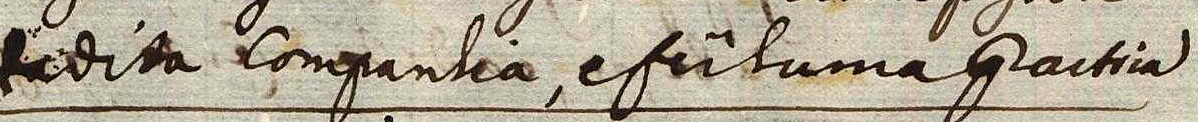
da dita Companhia, e fêz huma practica
